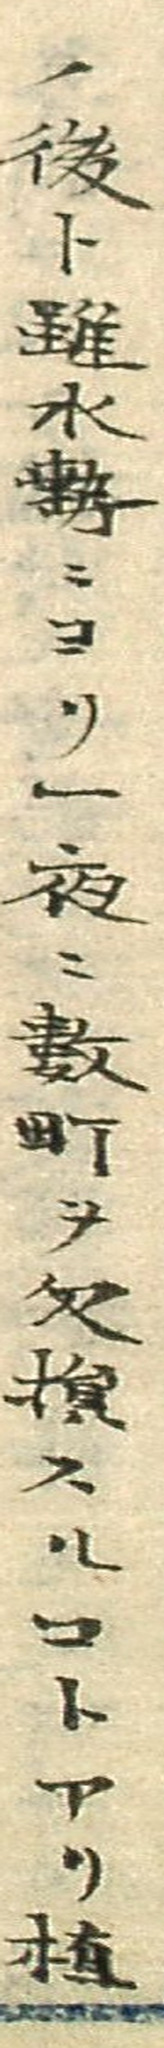ノ後ト雖水勢ニヨリ一夜ニ数町ヲ欠損スルコトアリ植
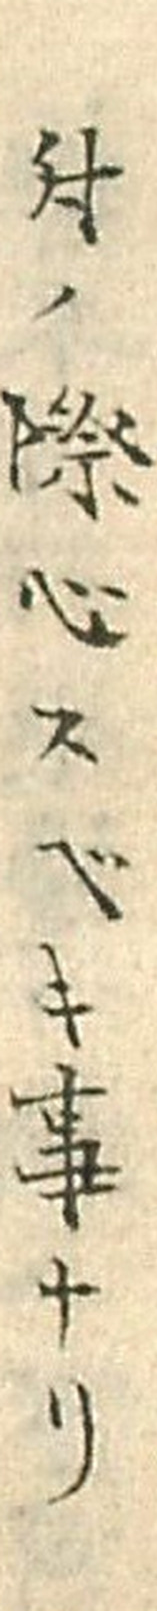付ノ際心スベキ事ナリ
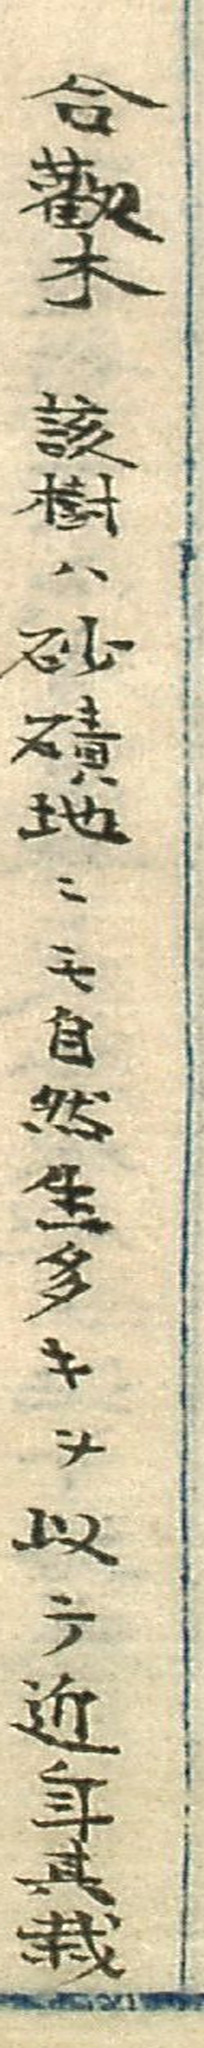合歓木該樹ハ砂磧地ニモ自然生多キヲ以テ近年其栽
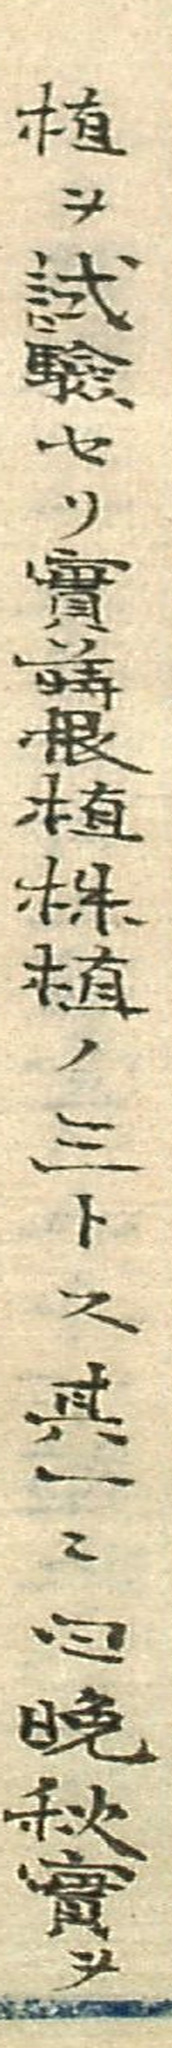植ヲ試験セリ実蒔根植株植ノ三トス其一ニ曰晩秋実ヲ
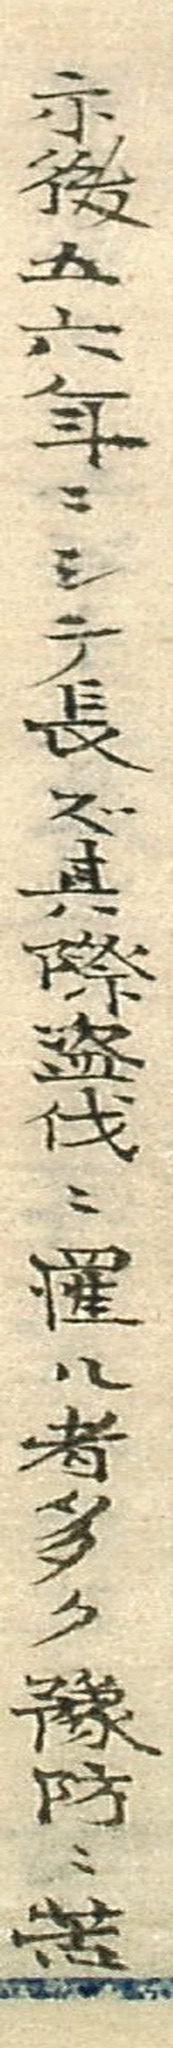示後五六年ニシテ長ズ其際盗伐ニ罹ル者多ク予防ニ苦
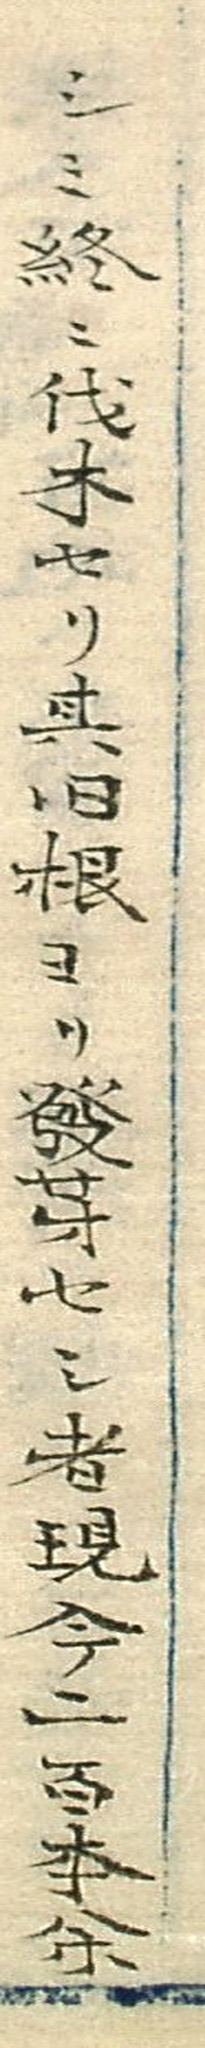シミ終ニ伐木セリ其旧根ヨリ発芽セシ者現今二百本余
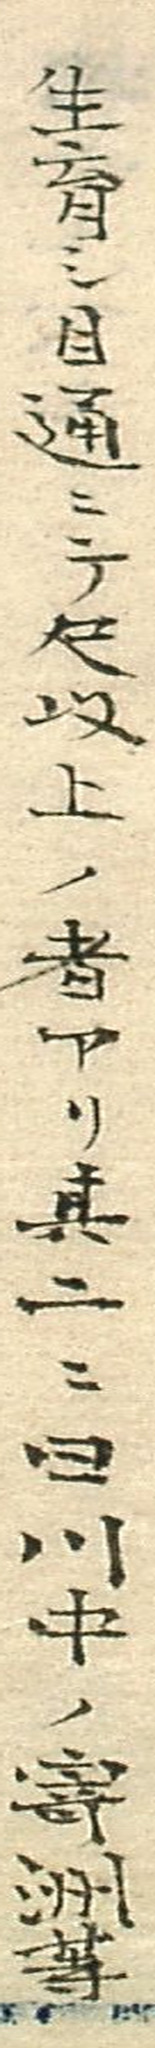生育シ目通ニテ尺以上ノ者アリ其二ニ曰川中ノ寄洲等
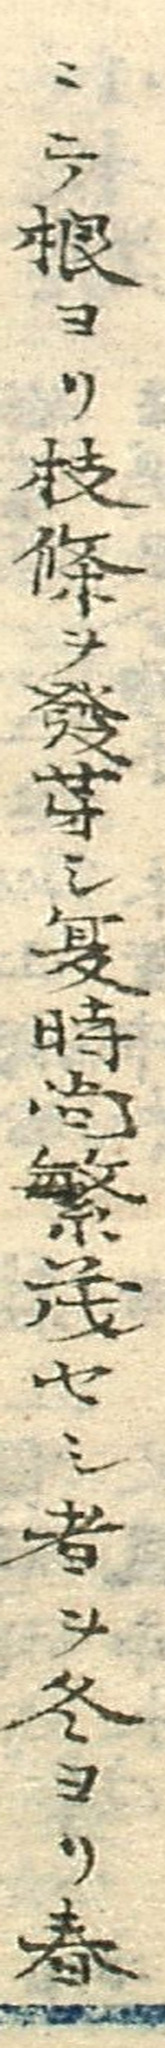ニテ根ヨリ枝条ヲ発芽シ夏時尚繁茂セシ者ヲ冬ヨリ春
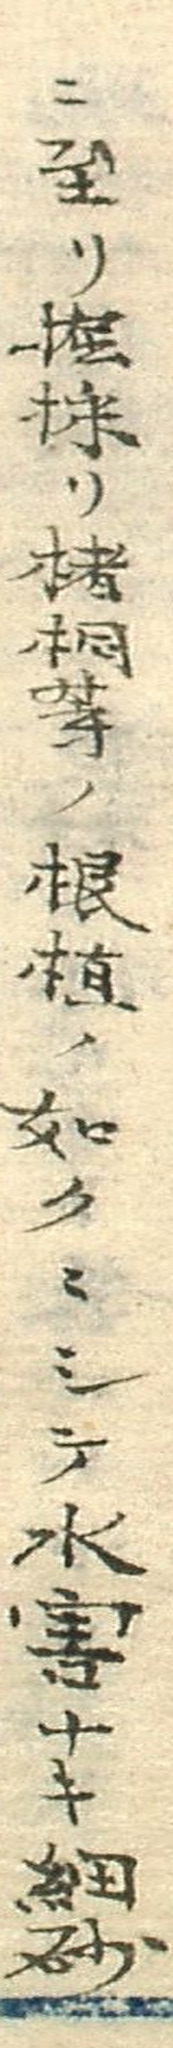ニ至リ掘採リ楮桐等ノ根植ノ如クニシテ水害ナキ細砂
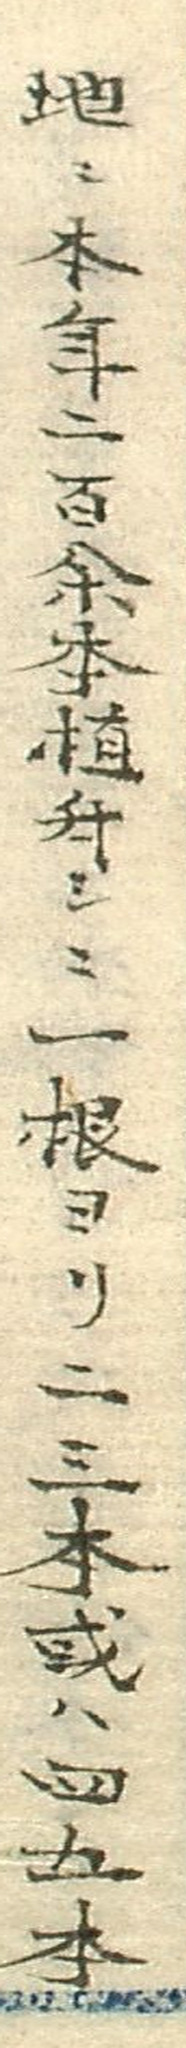地ニ本年二百余本植付シニ一根ヨリ二三本或ハ四五本
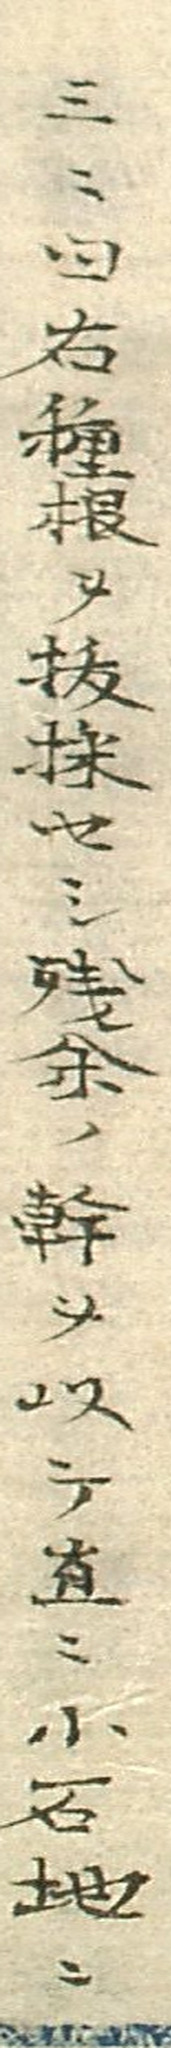三ニ曰右種根ヲ抜採セシ残余ノ幹ヲ以テ直ニ小石地ニ
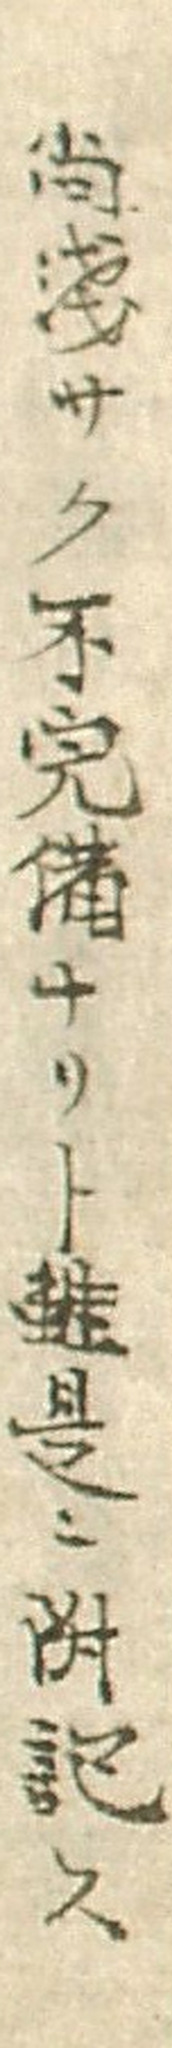尚浅サク不完備ナリト雖是ニ附記ス

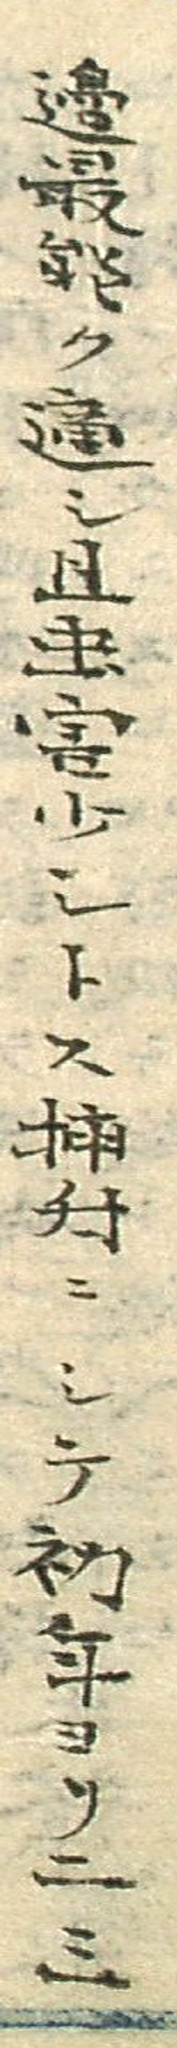辺最能ク適シ且虫害少シトス挿付ニシテ初年ヨリ二三
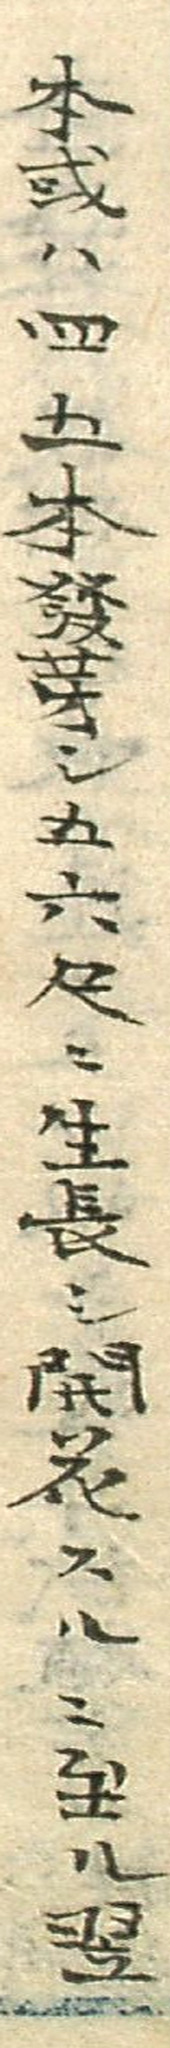本或ハ四五本発芽シ五六尺ニ生長シ開花スルニ至ル翌
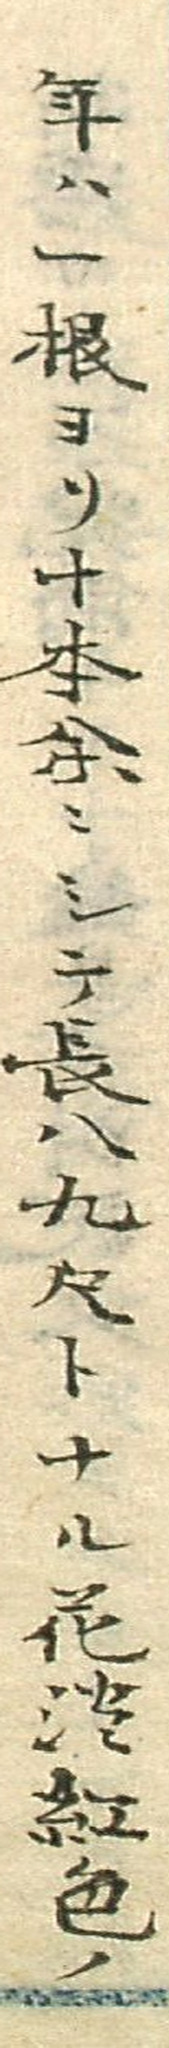年ハ一根ヨリ十本余ニシテ長八九尺トナル花淡紅色ノ
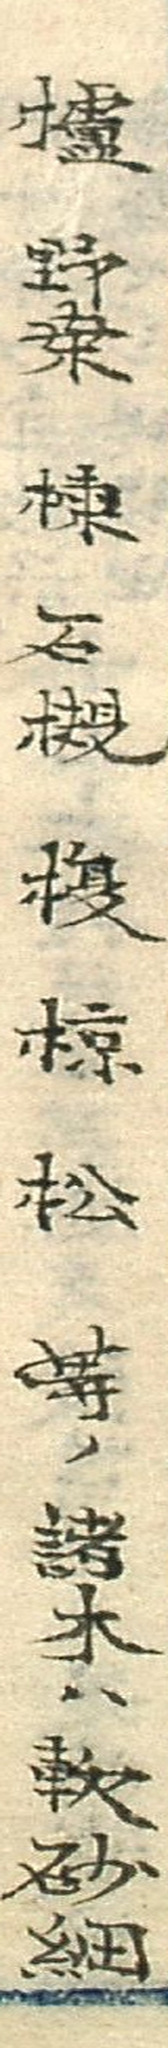櫨野桑楝石槻榎椋松等ノ諸木ハ軟砂細
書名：山林共進会取調書
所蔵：鳴門教育大学 Naruto University of Education
